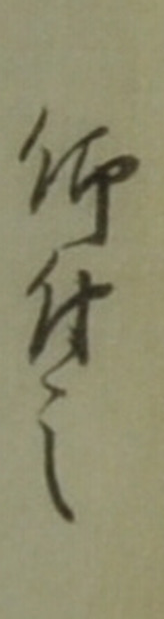仰付之
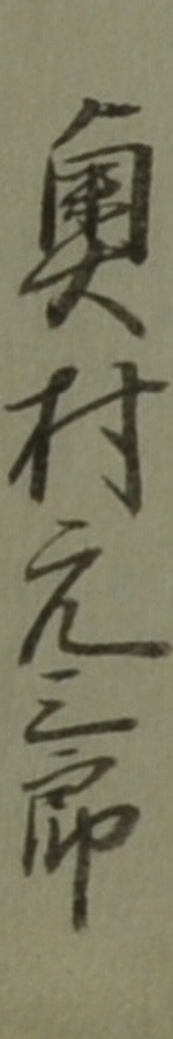奥村元三郎
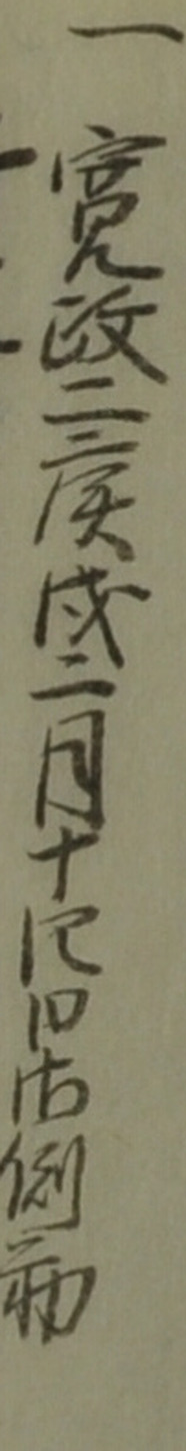一寛政二庚二月十四日御側勤
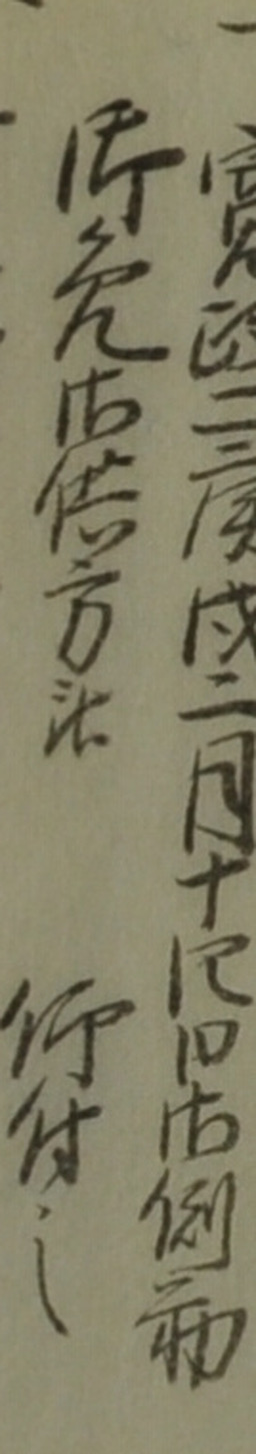御免御供方被仰付之
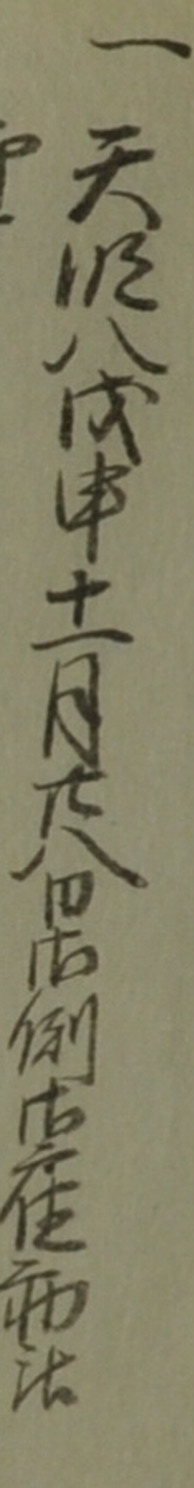一天明八戊申十一月廿八日御側御雇勤被
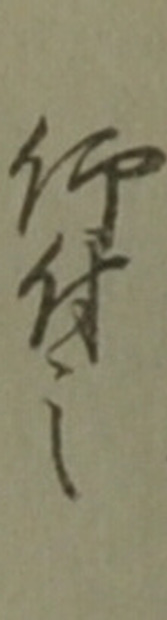仰付之
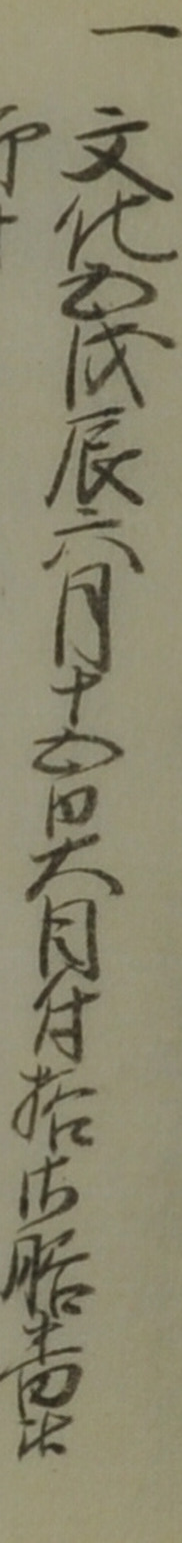一文化五戊辰六月十五日大目付格御膳番被
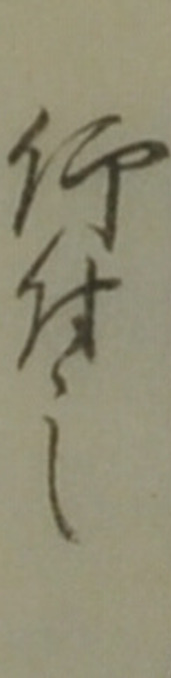仰付之
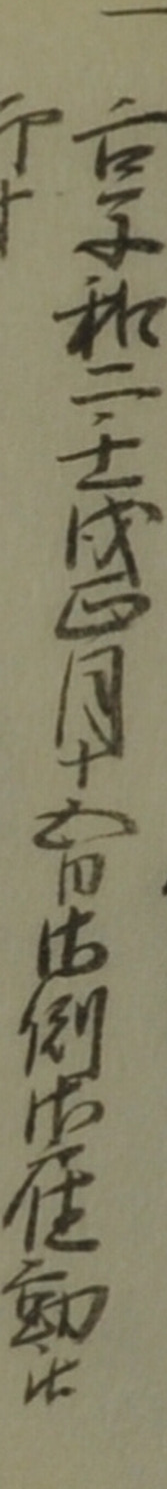一享和二壬戌正月十五日御側御雇勤被
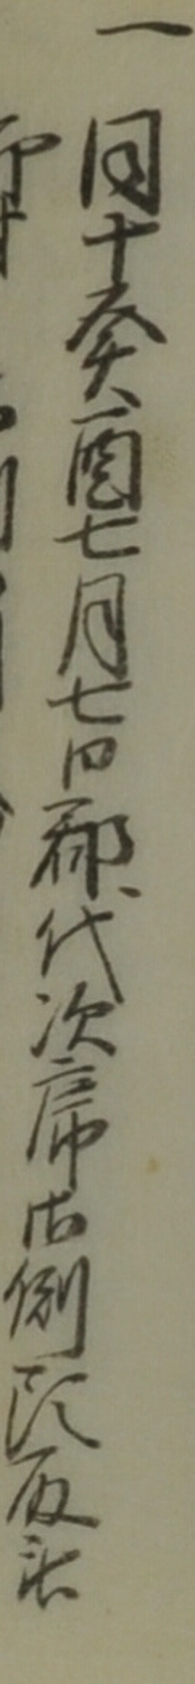一同十癸酉七月七日郡代次席御側頭取被
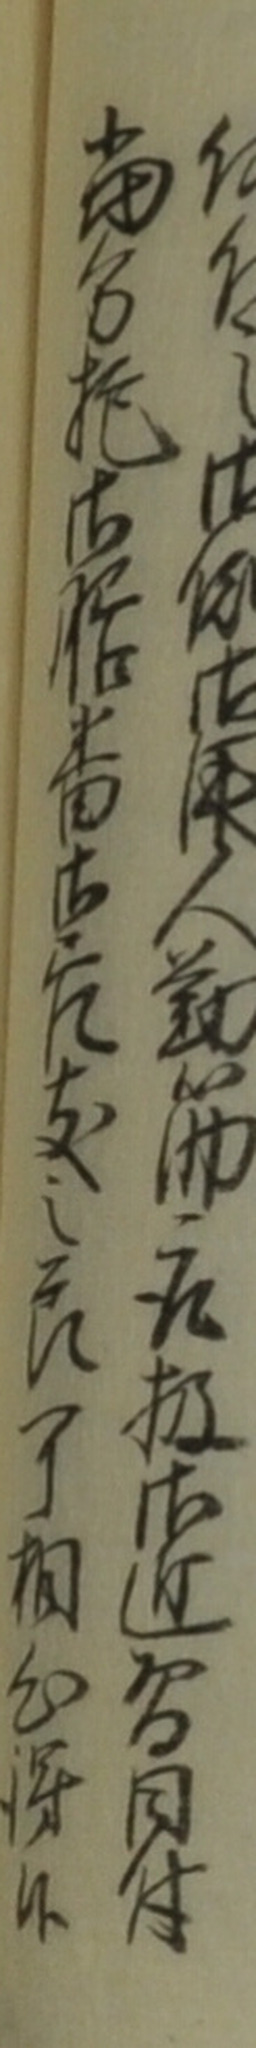当方抱御膳番御差支之節可相心得候
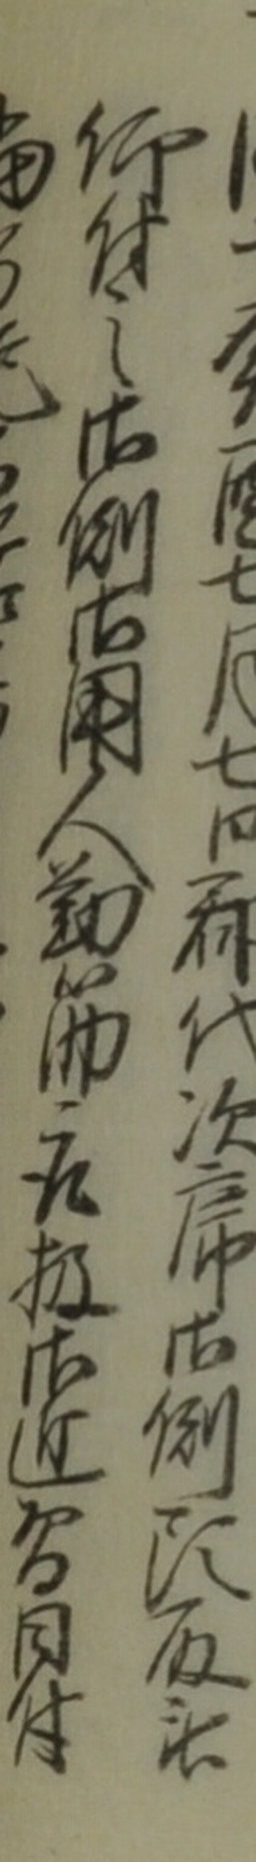仰付之御側御用人勤筋取扱御近習目付
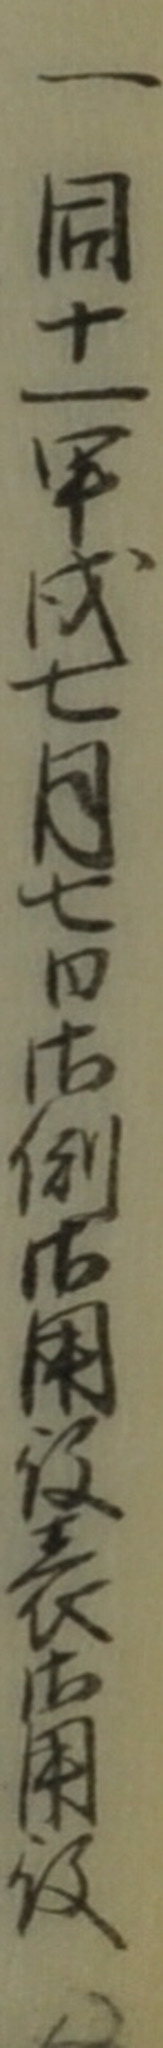同十一甲戌七月七日御側御用役表御用役
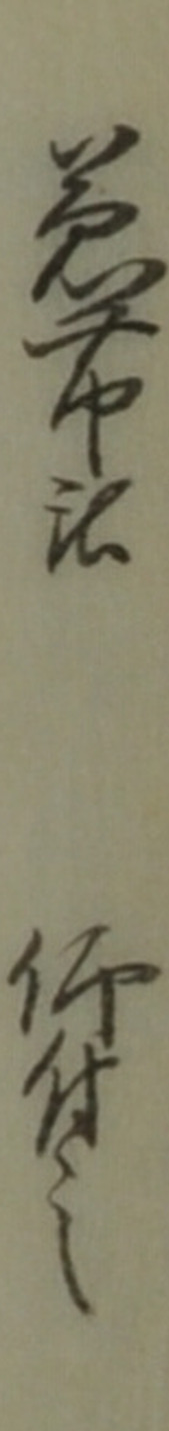兼帯被仰付之
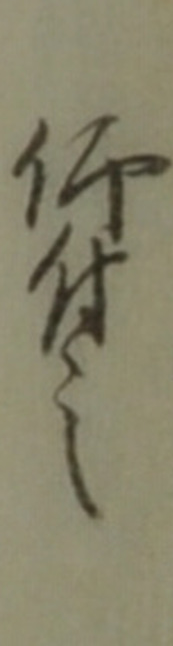仰付之
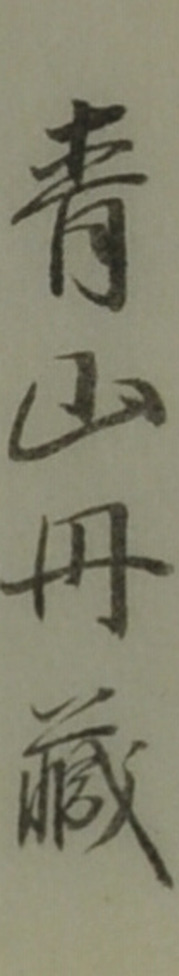青山丹蔵
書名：諸御役代々録（五）
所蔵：伊那市立高遠町図書館・合同会社AMANE
